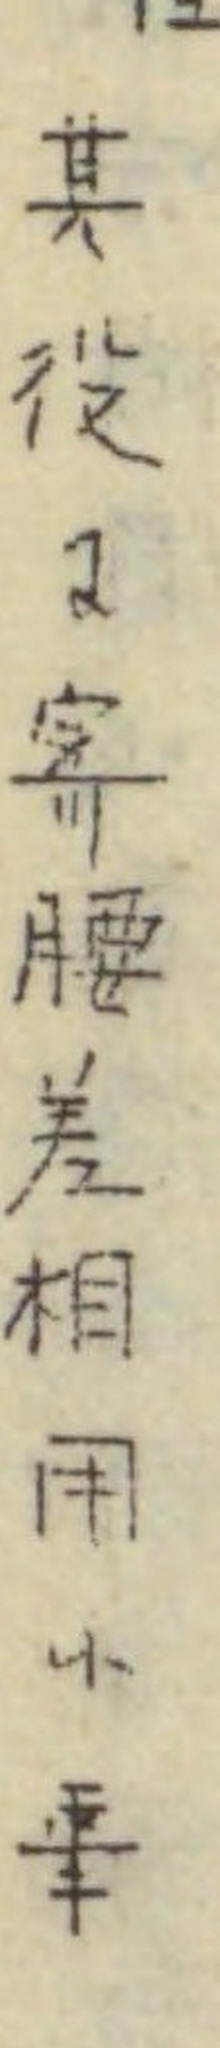但其役に寄腰差相用候事
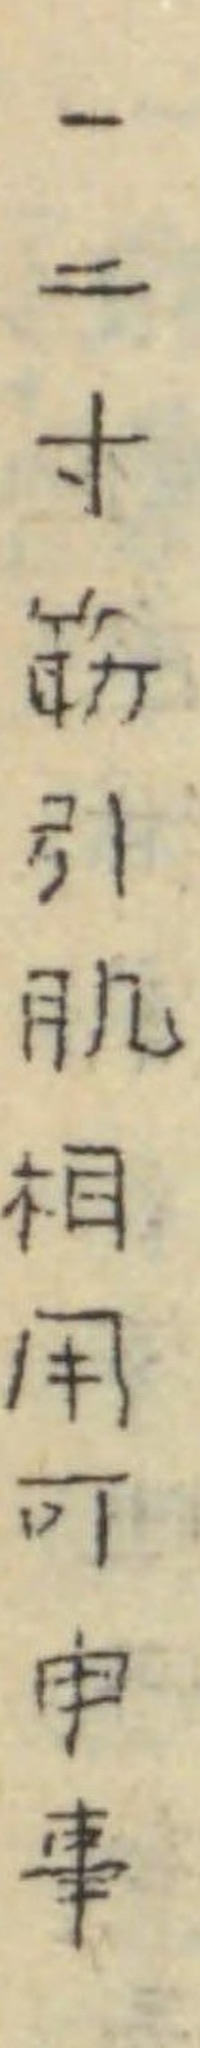一二寸筋引肌相用可申事

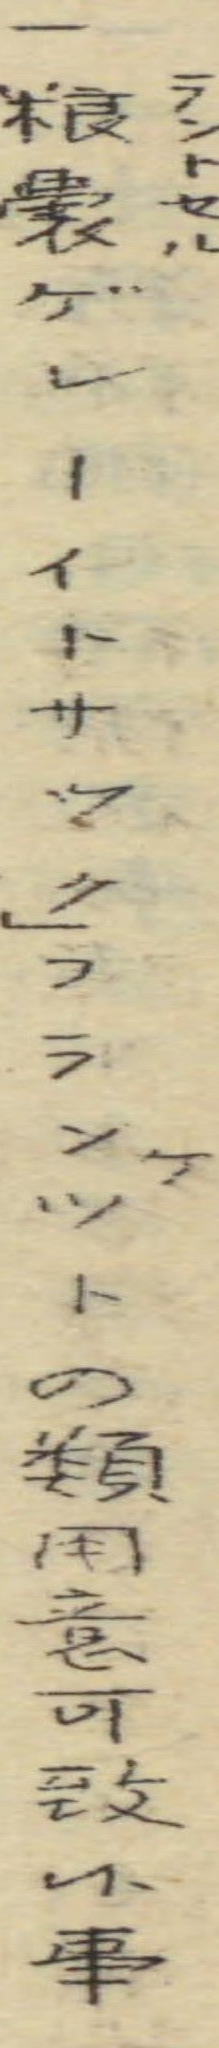一粮嚢ゲレーイトサツク」フランケットの類用意可致候事
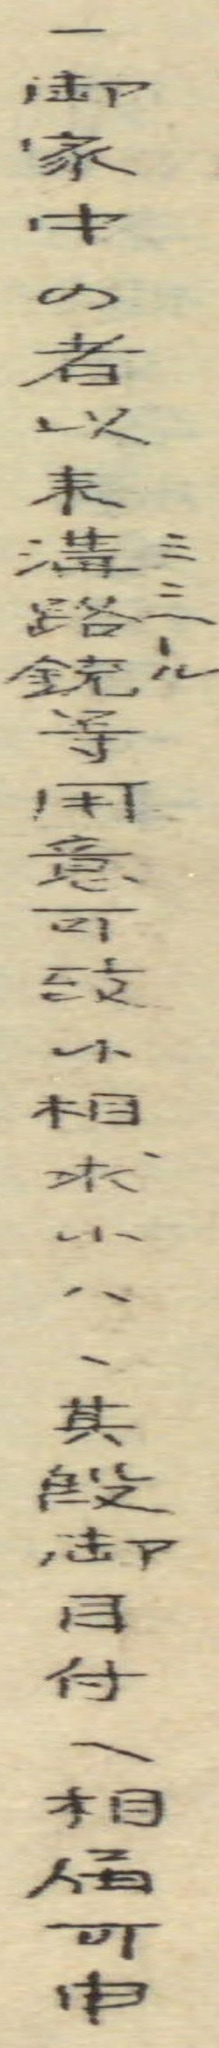一御家中の者以来溝路銃等用意可致候相求候ハゝ其段御目付へ相届可申
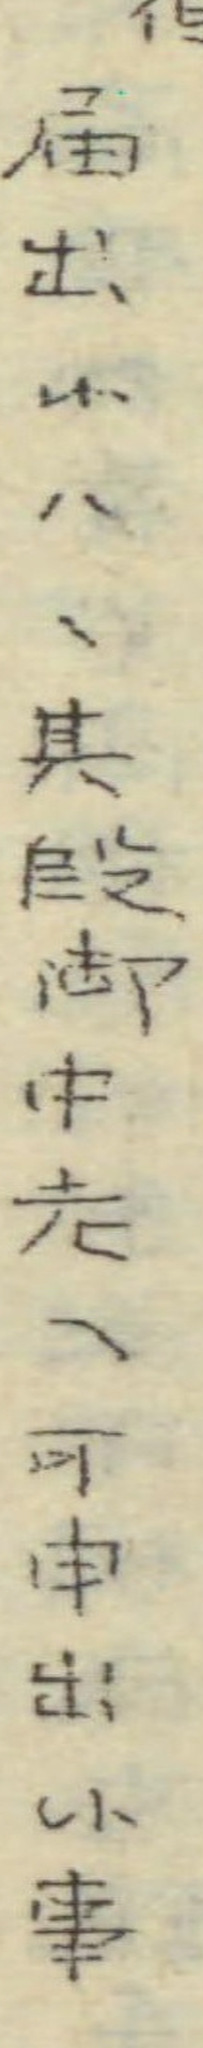但届出候ハゝ其段御中老へ可申出候事
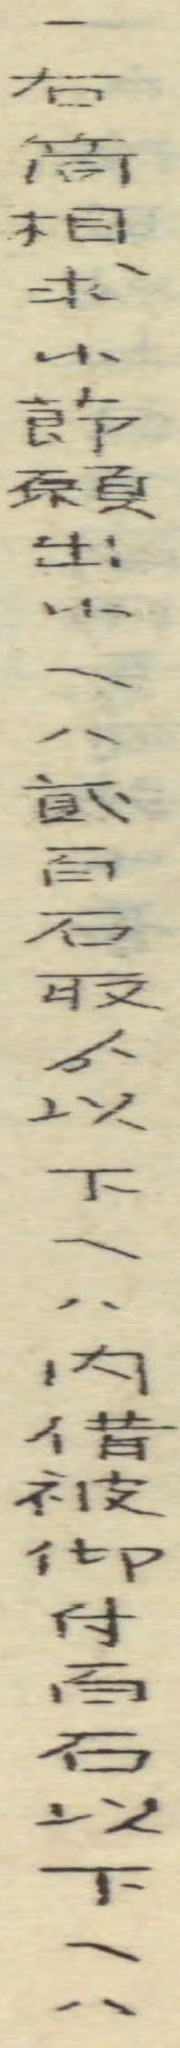一右筒相求候節願出候へハ弐百石取ゟ以下へハ内借被仰付百石以下ヘハ
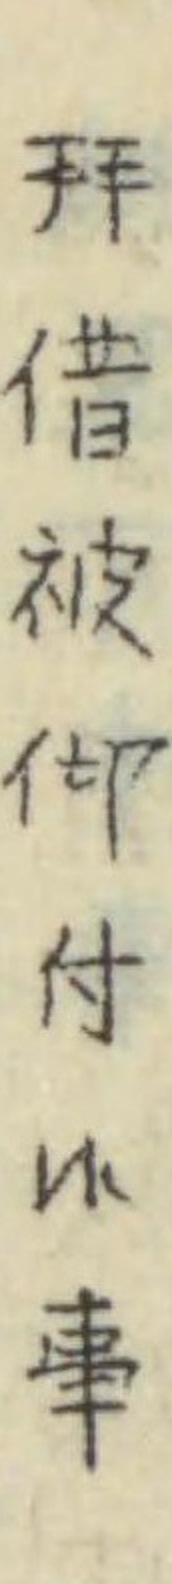拝借被仰付候事
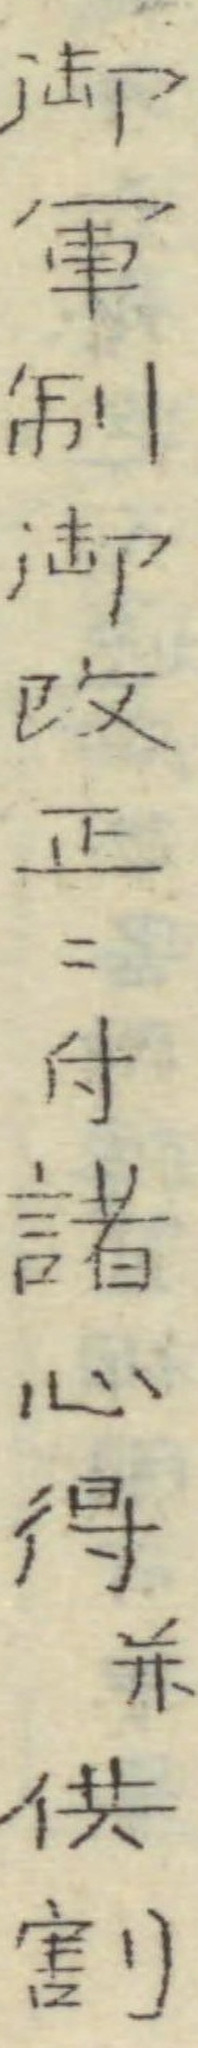御軍制御改正二付諸心得并供割
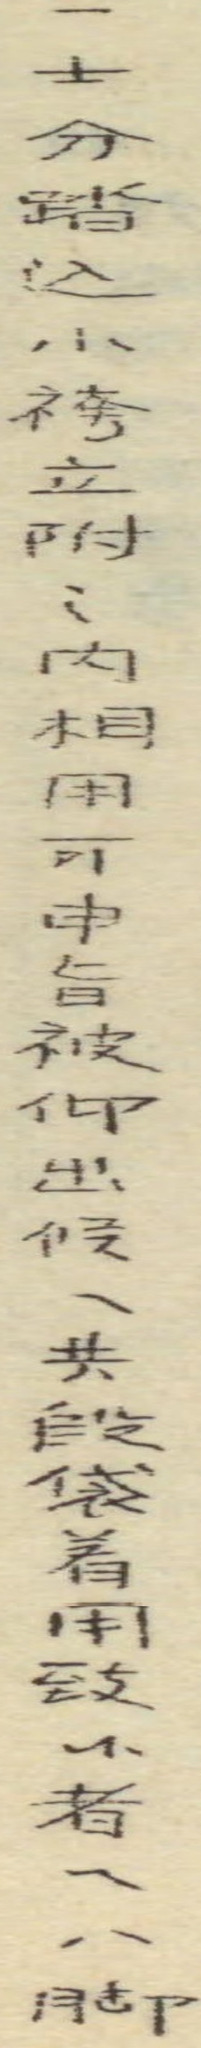一士分踏込小袴立附之内相用可申旨被仰出候へ共段袋着用致候者へハ脚
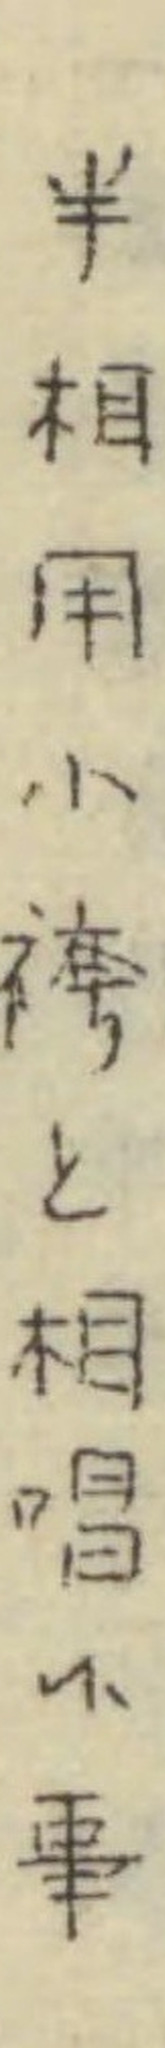半相用小袴と相唱候事
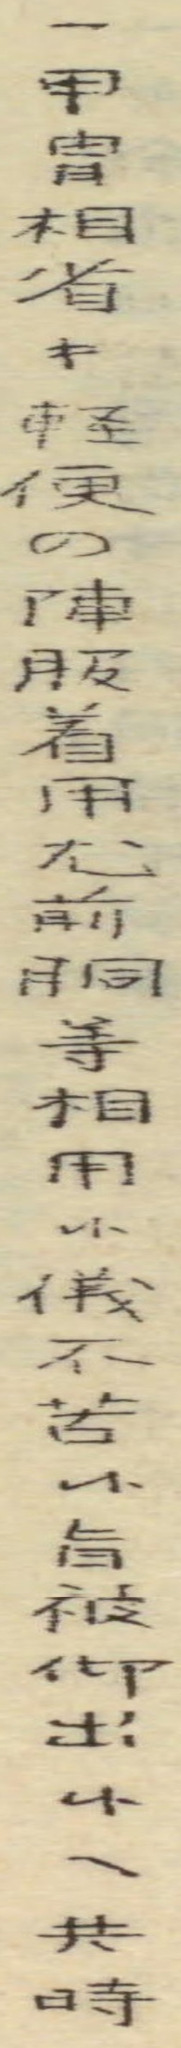一甲冑相省キ軽便の陣服着用尤前胴等相用候義不苦候旨被仰出候へ共時
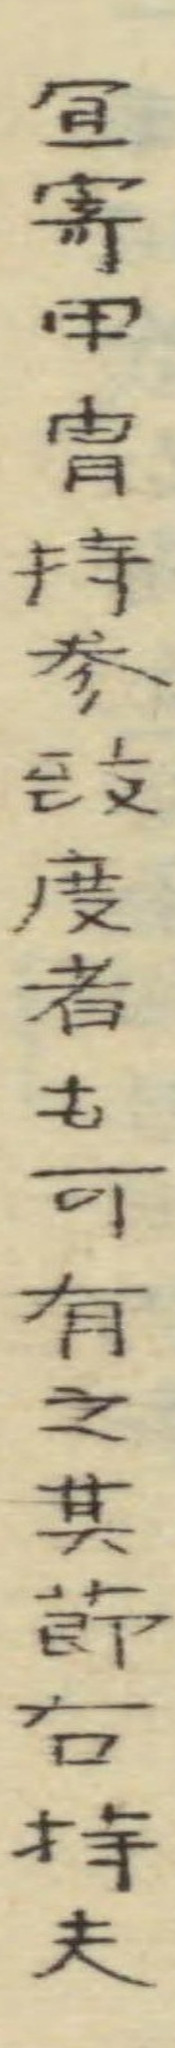宣寄甲冑持参致度者も可有之其節右持夫
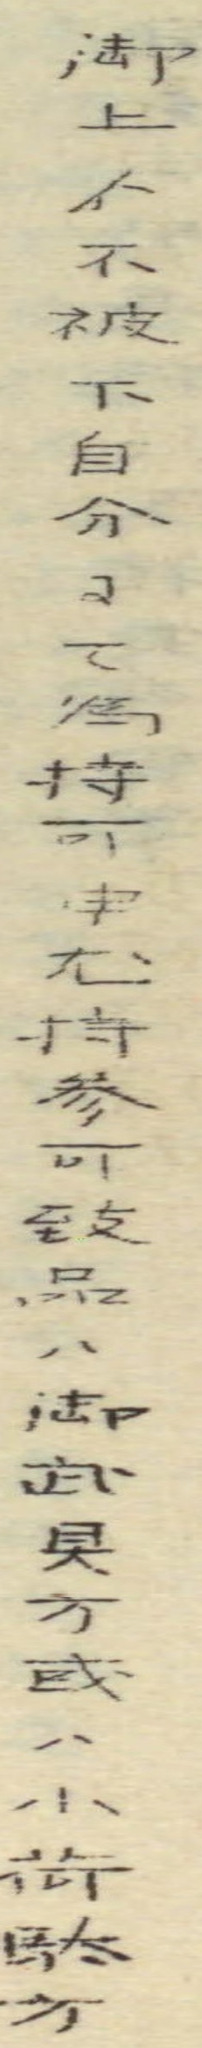御上ゟ不被下自分にて為持可申尤持参可致品ハ御武具方或ハ小荷駄方
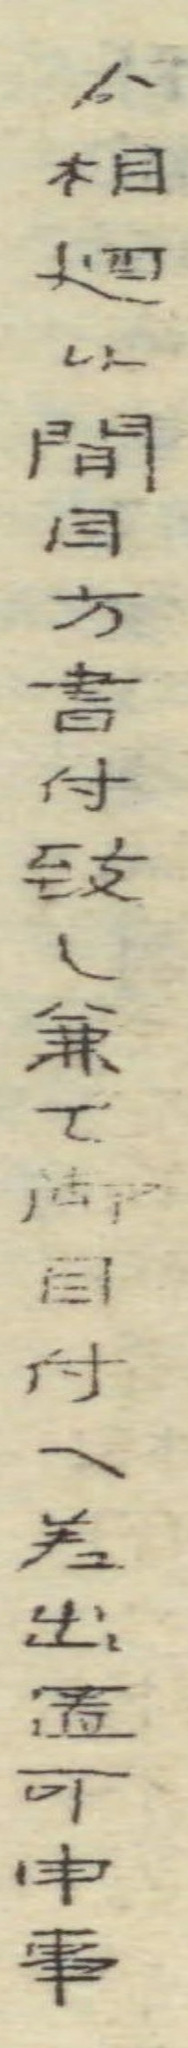ゟ相廻候間目方書付致し兼て御目付へ差出置可申事
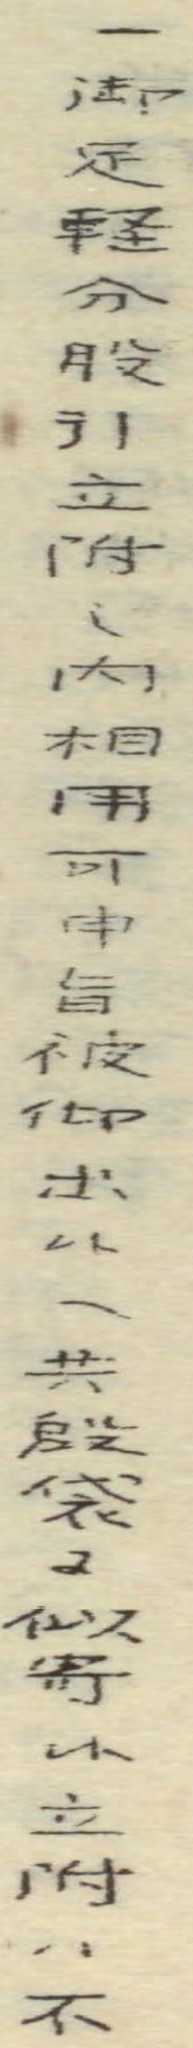一御足軽分股引立附之内相用可申旨被仰出候へ共段袋に似寄候立附ハ不
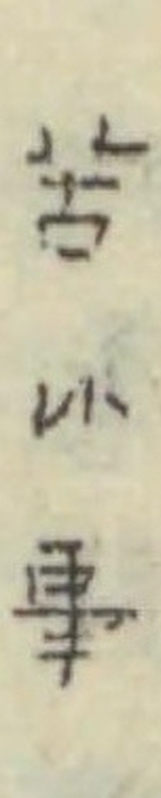苦候事
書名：三河吉田藩動員史料
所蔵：国立国会図書館 National Diet Library, JAPAN
